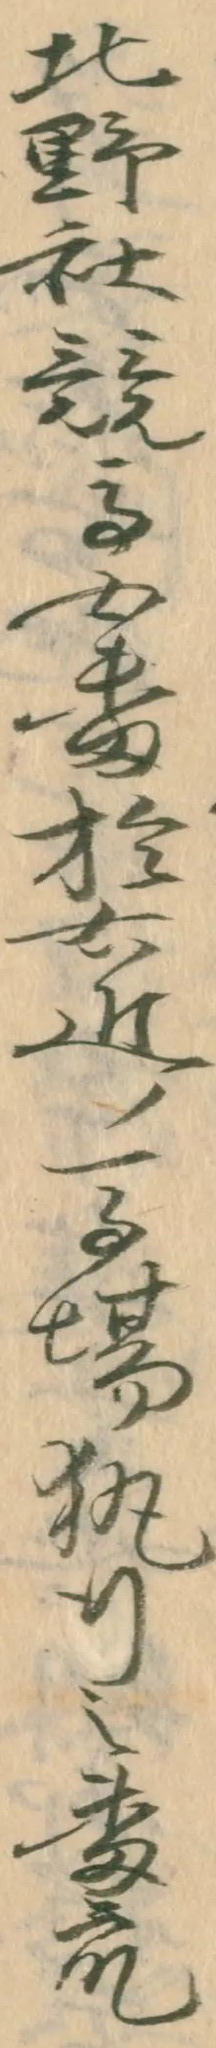北野社競馬五番於右近ノ馬場執行之番衆
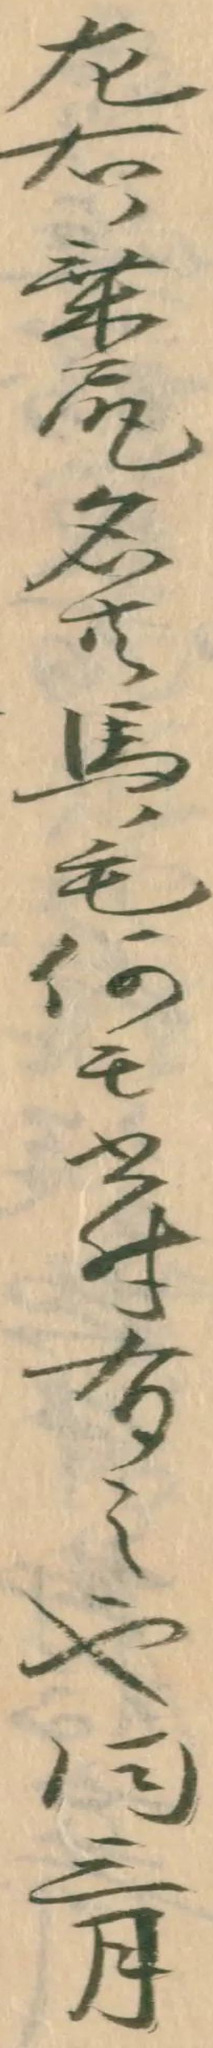左右ノ乗尻名共馬ノ毛何モ書付有之也同三月
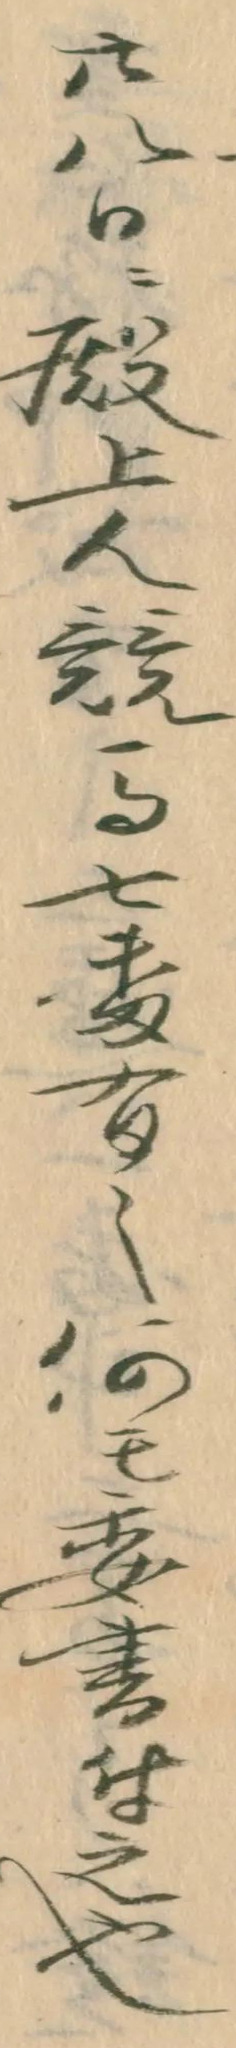廿八日ニ殿上人競馬七番有之何モ委書付之也
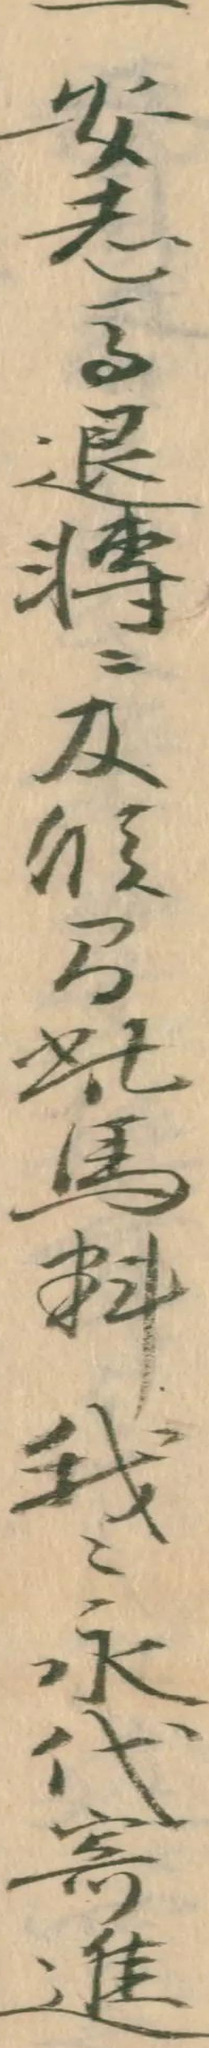一安志馬退転ニ及候間此馬料我々永代寄進
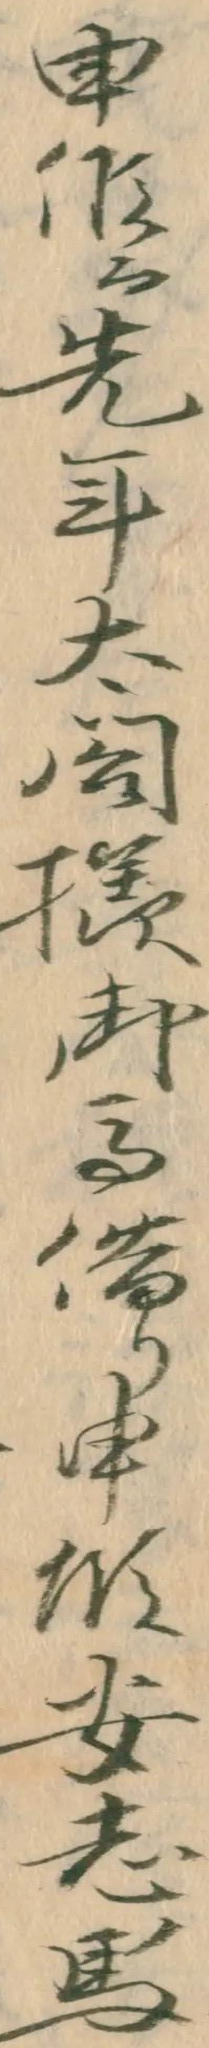申候而先年太閤様御馬借り申候安志ノ馬
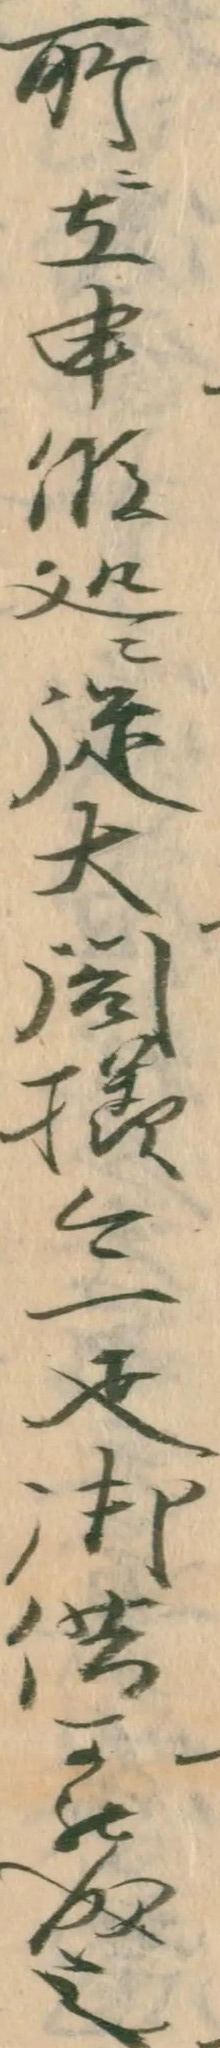所に立申候処ニ従大閤様今一疋御借可被成也
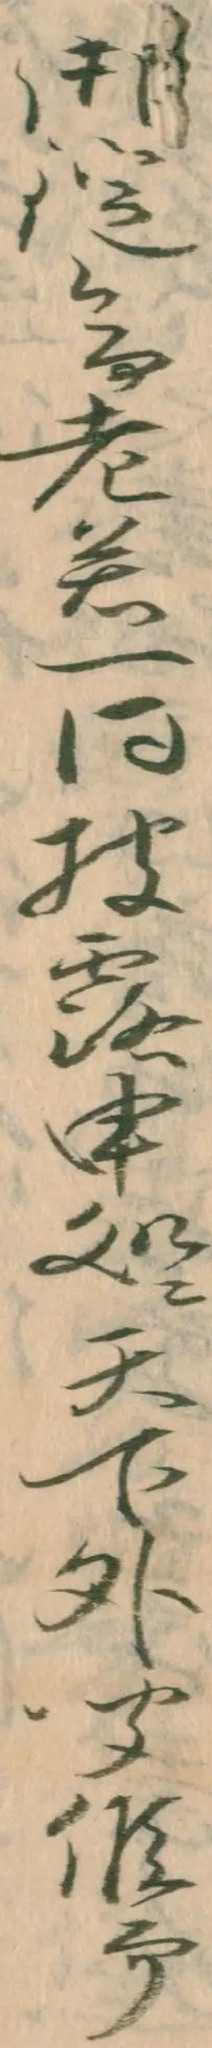御錠候而老若一同披露申処ニ天下外聞候而
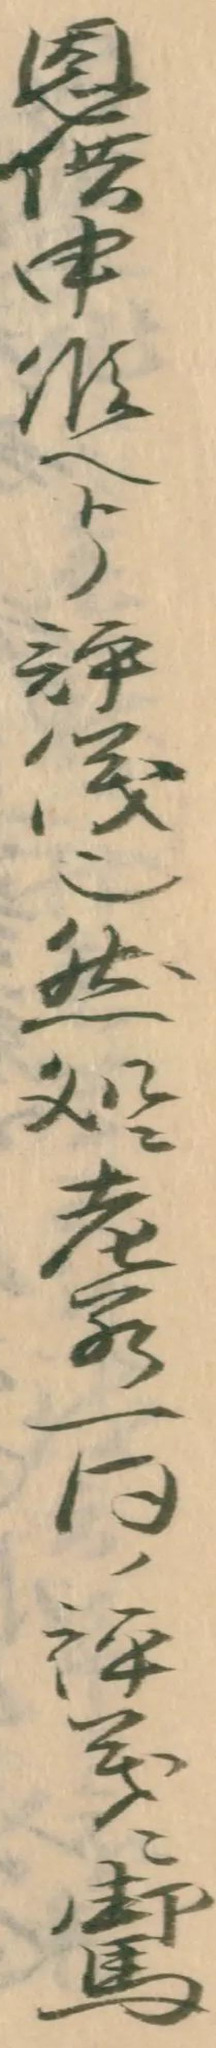恩借申候へトノ評議也然処ニ老若一同ノ評義ニ御馬
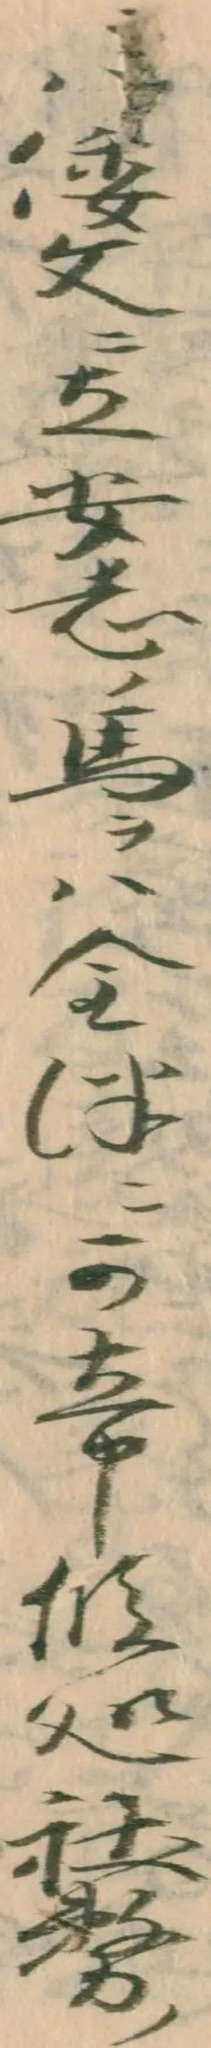ハ倭文ニ立安志ノ馬ヲハ金津に可立申候処社務の
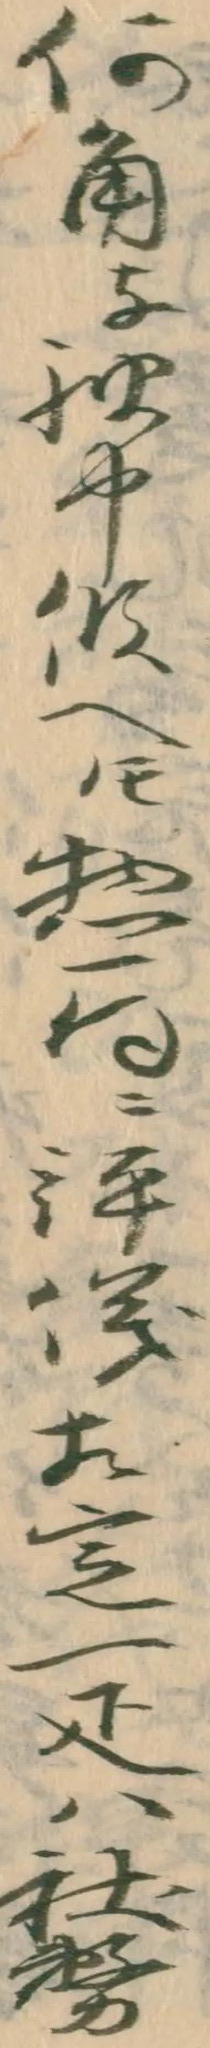何角と被申候へトモ惣一同に評議相定一疋ハ社務
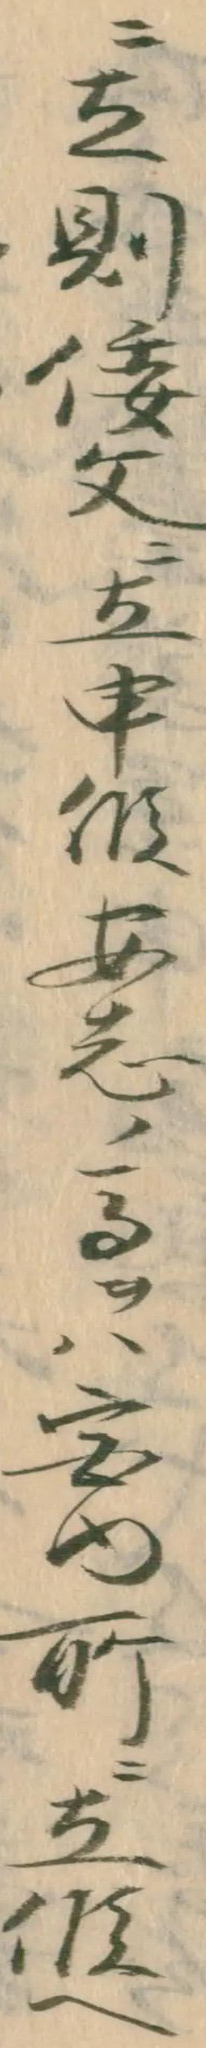ニ立則倭文ニ立申候安志ノ馬ヲハ案内所ニ立候へ
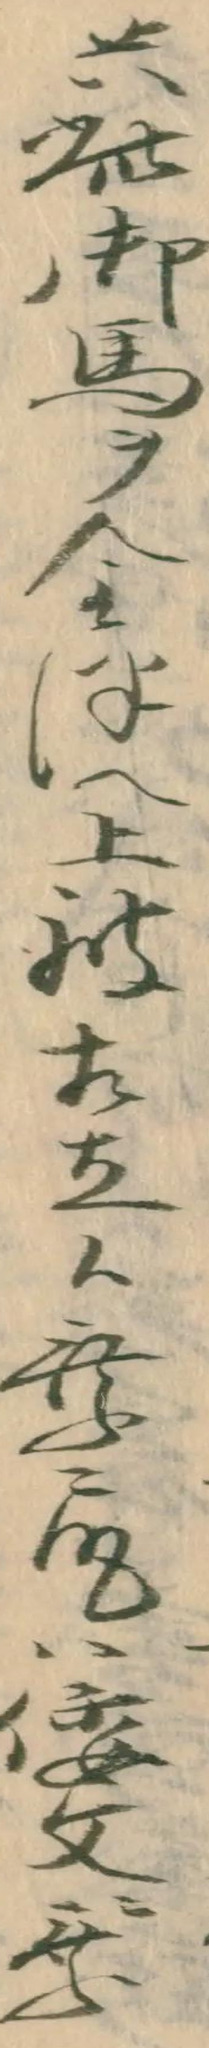共此御馬ヲ金津へ上被相立候乗尻ハ倭文ニ乗
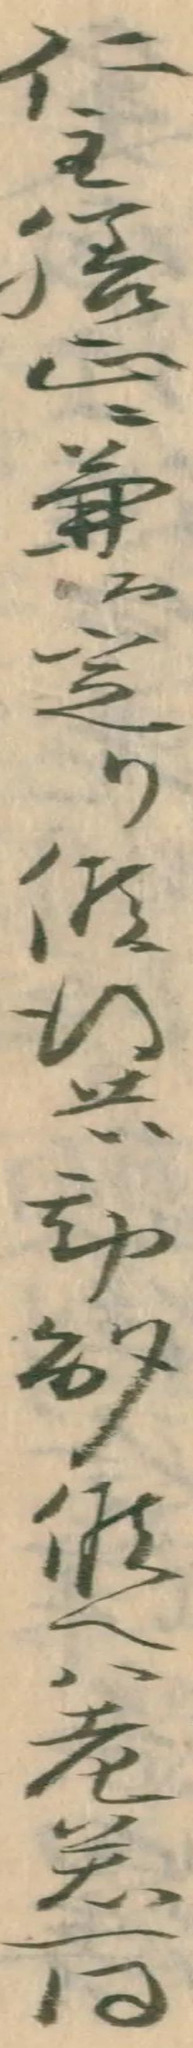仁主膳正ニ兼而定り候得共勘酌候ヘハ老若一同
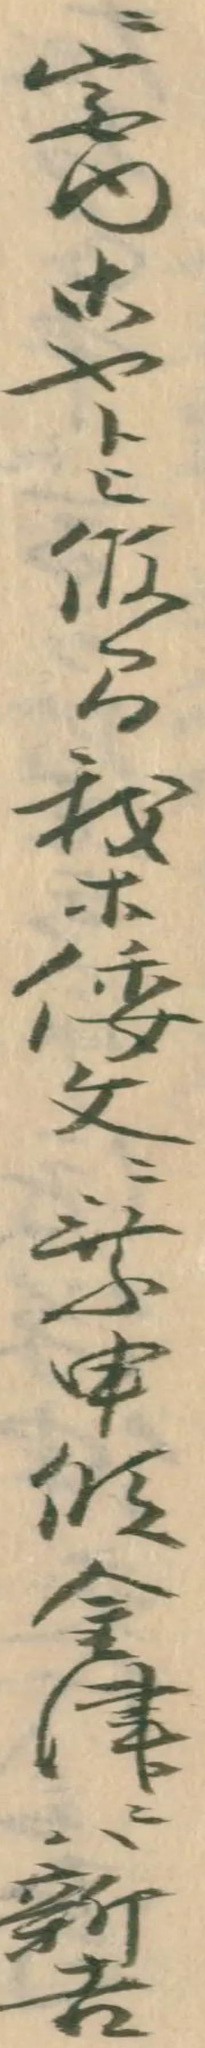ニ案内御ヤトヒ候間我等倭文ニ乗申段金津ニハ新吉
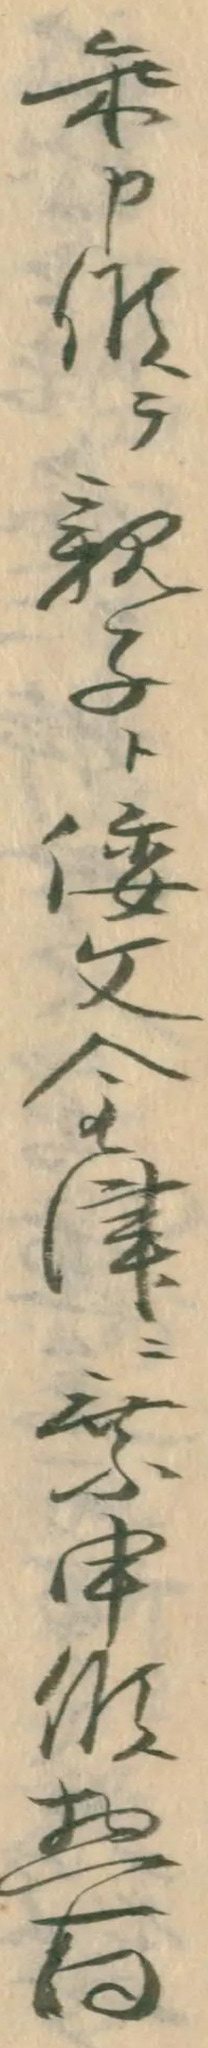乗申候テ親子ト倭文金津ニ乗申侯惣一同
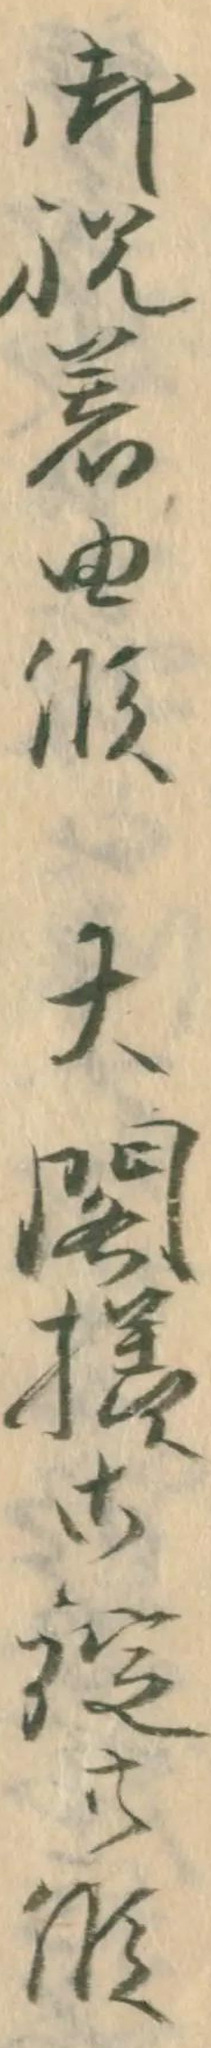御祝着由候太閤様御錠共候
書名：賀茂社記録. 第12冊
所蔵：国立国会図書館 National Diet Library, JAPAN
